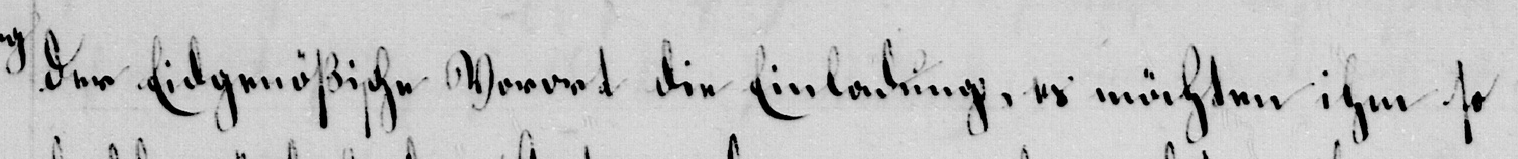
der Eidgenößische Vorort die Einladung, es möchten ihm so
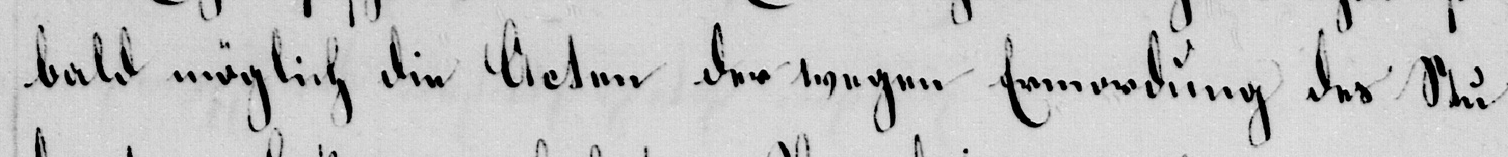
bald möglich die Acten der wegen Ermordung des Stu¬
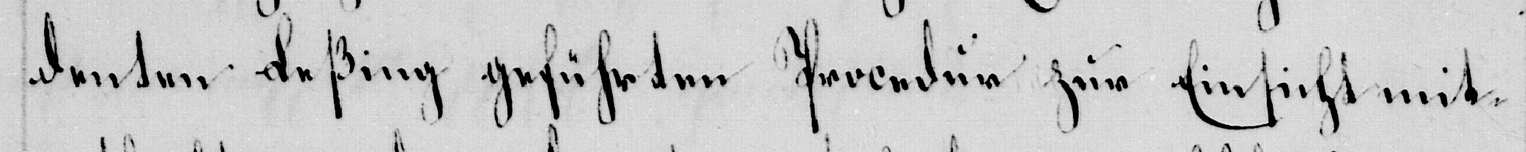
denten Leßing geführten Procedur zur Einsicht mit¬
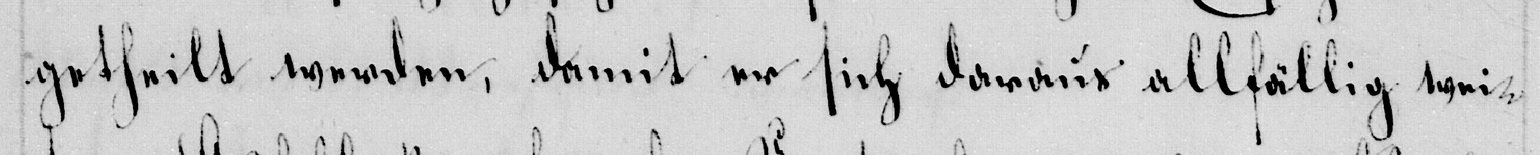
getheilt werden, damit er sich daraus allfällig wei¬
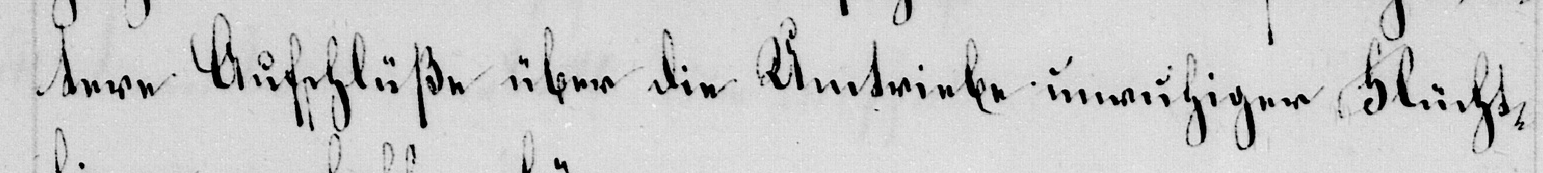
tere Aufschlüße über die Umtriebe unruhiger Flücht¬
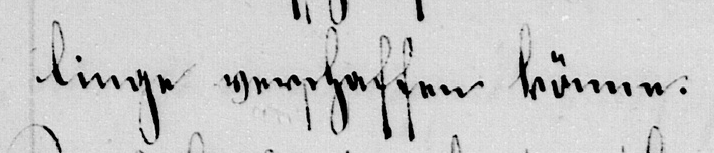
linge verschaffen könne.
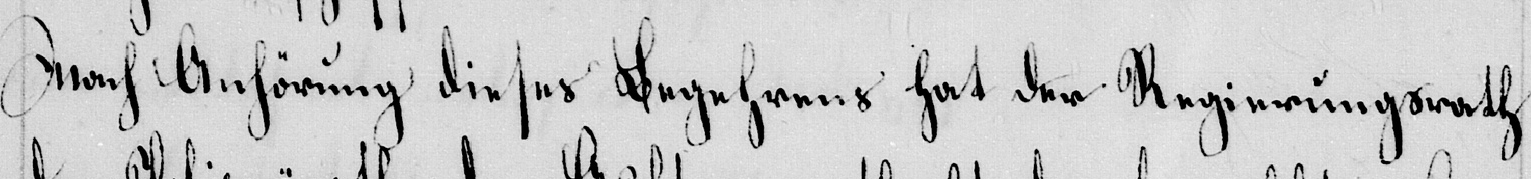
Nach Anhörung dieses Begehrens hat der Regierungsrath
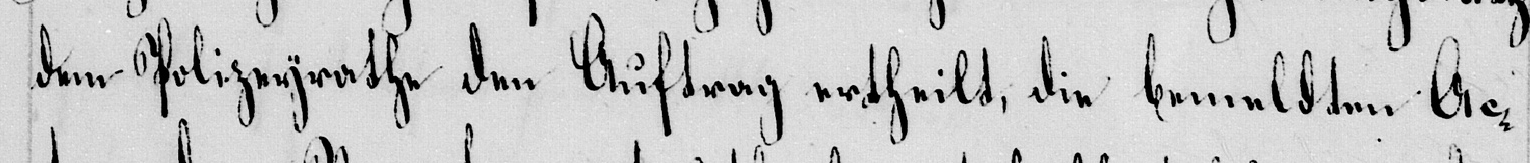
dem Polizeyrathe den Auftrag ertheilt, die bemeldeten Ac¬
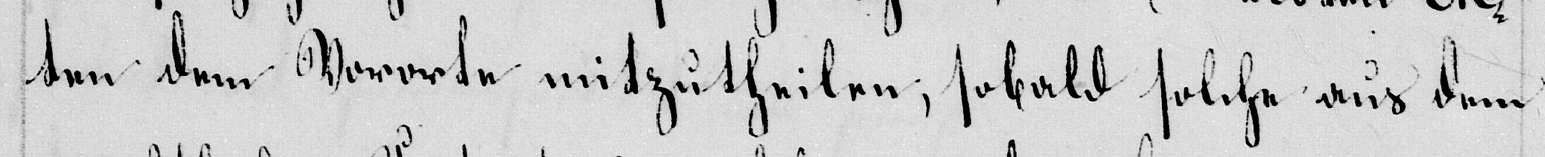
ten dem Vororte mitzutheilen, sobald solche aus dem
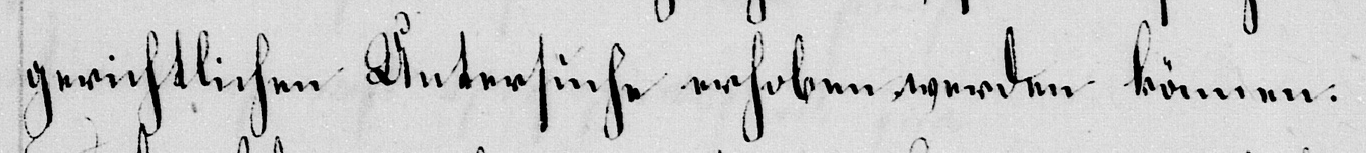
gerichtlichen Untersuche erhoben werden können.
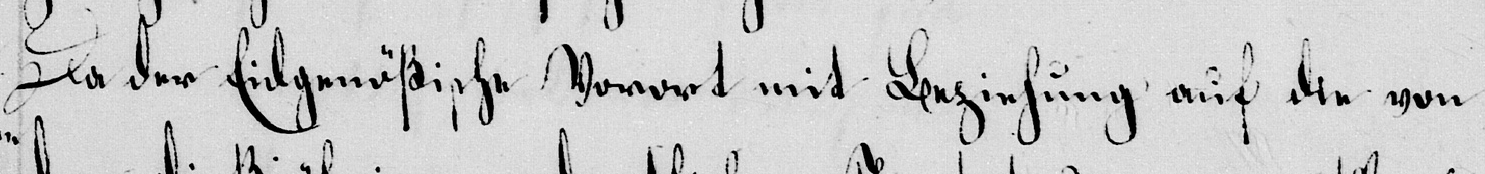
Da der Eidgenößische Vorort mit Beziehung auf die von
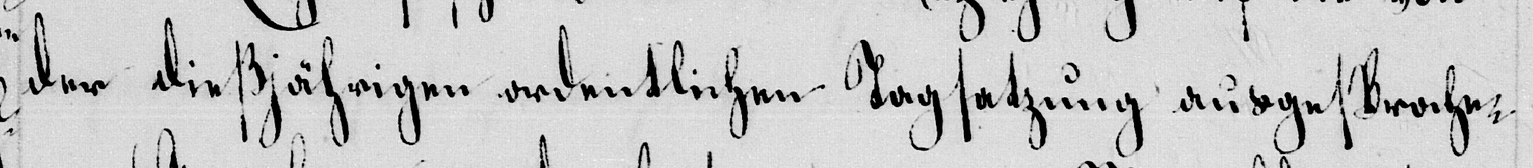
der dießjährigen ordentlichen Tagsatzung ausgesproche¬
